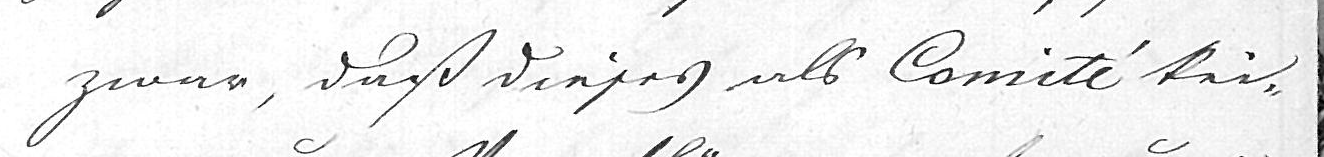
zwar, daß dieses als Comité kei-
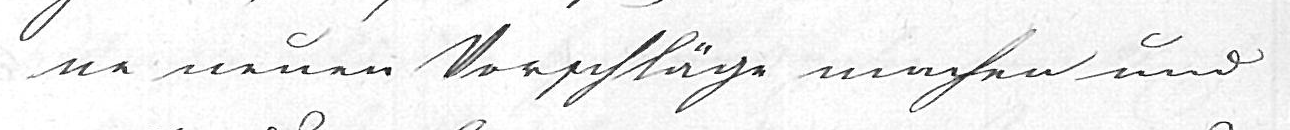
ne neuen Vorschläge machen und
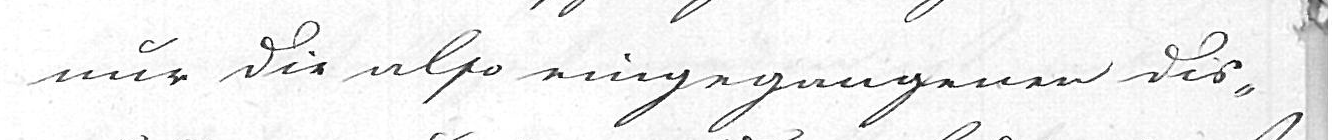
nur die also eingegangenen dis-
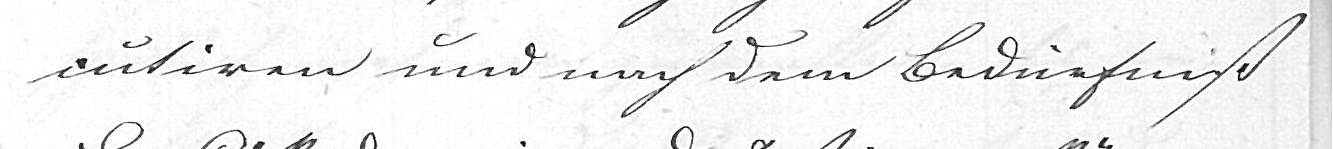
cutiren und nach dem Bedürfniß
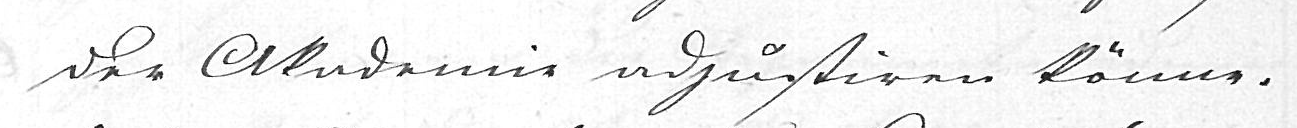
der Akademie adjustiren könne.
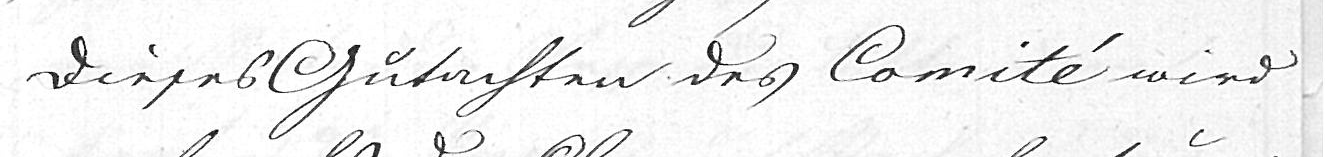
Dieses Gutachten des Comité wird
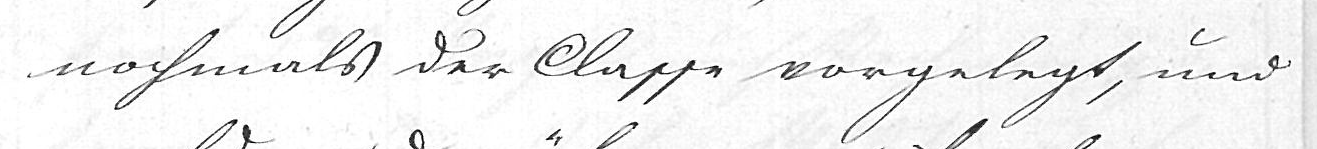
nochmals der Classe vorgelegt, und
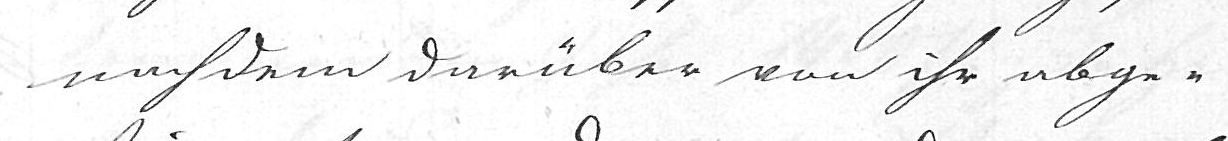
nachdem darüber von ihr abge-
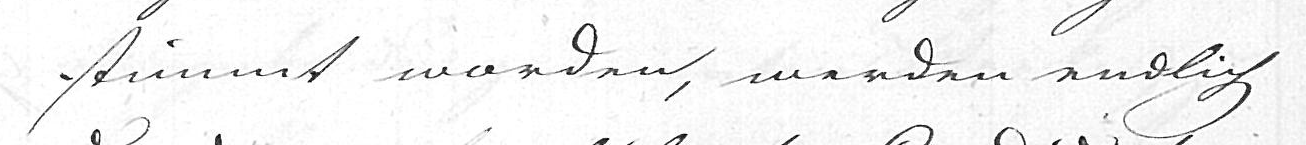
stimmt worden, werden endlich
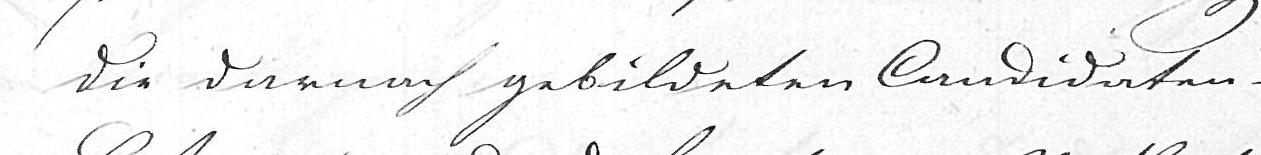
die darnach gebildeten Candidaten-
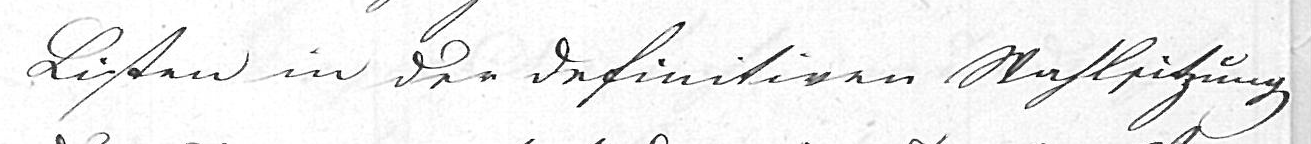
Listen in der definitiven Wahlsitzung
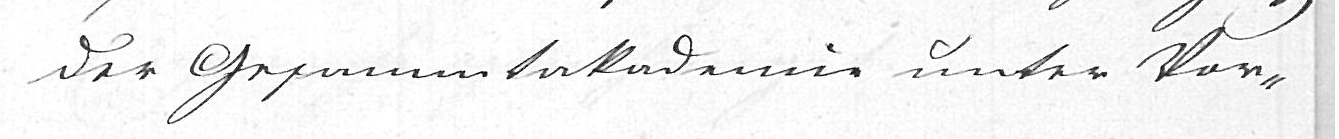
der Gesammtakademie unter Vor-
